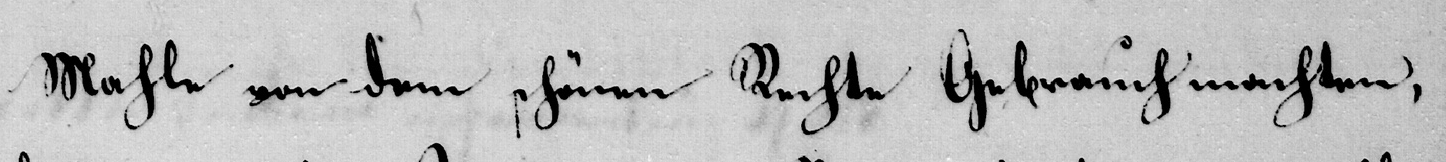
Mahle von dem schönen Rechte Gebrauch machten,
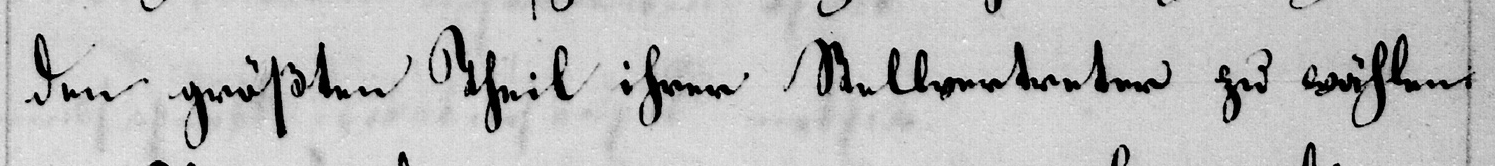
den größten Theil ihrer Stellvertreter zu wählen.
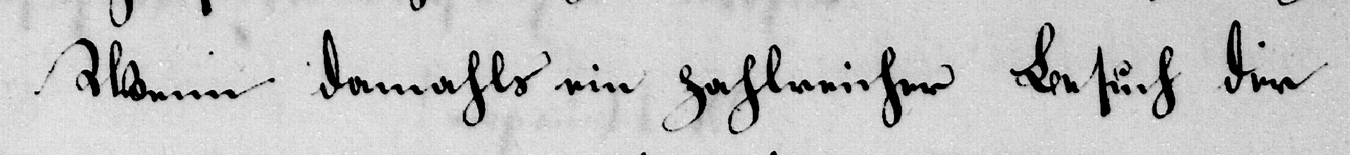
Wenn damals ein zahlreicher Besuch der
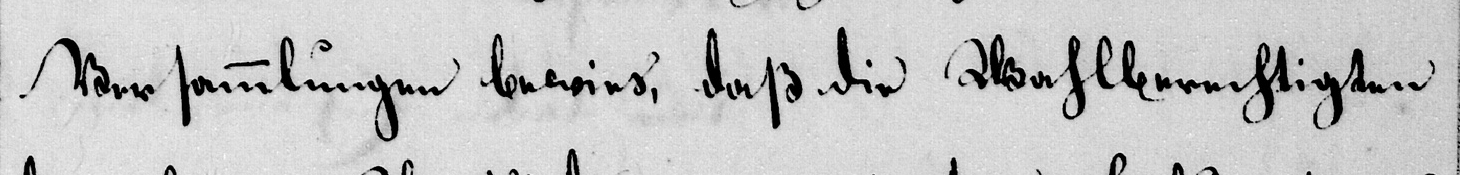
Versammlungen bewies, daß die Wahlberechtigten
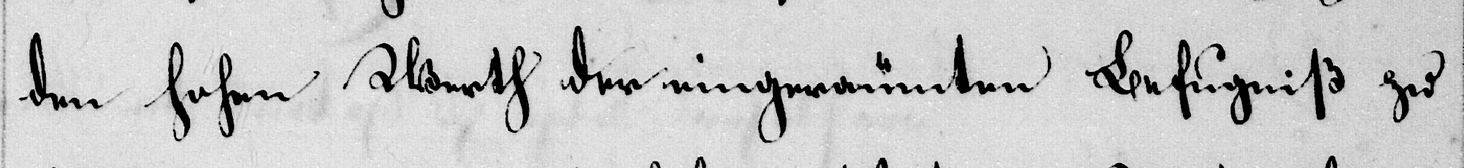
den hohen Werth der eingeräumten Befugniß zu
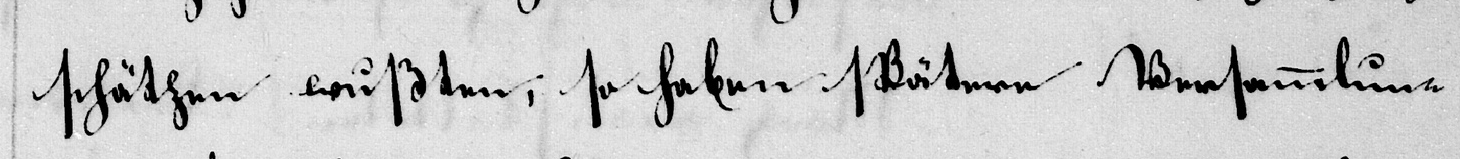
schätzen wußten, so haben spätere Versammlun¬
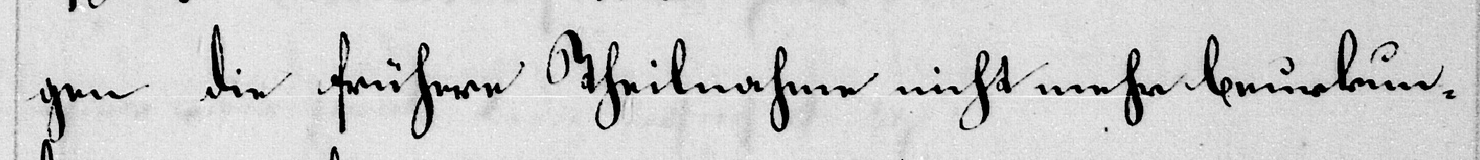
gen die frühere Theilnahme nicht mehr beurkun¬
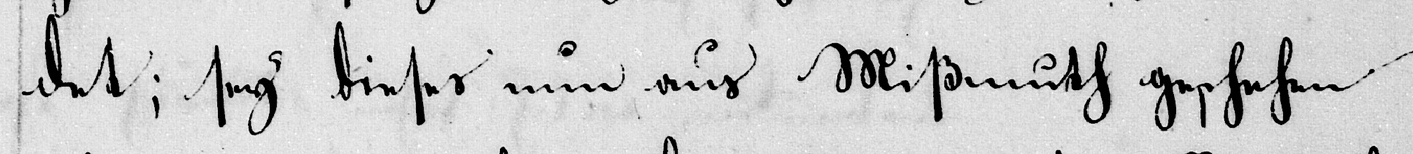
det; sey dieses nun aus Mißmuth geschehen
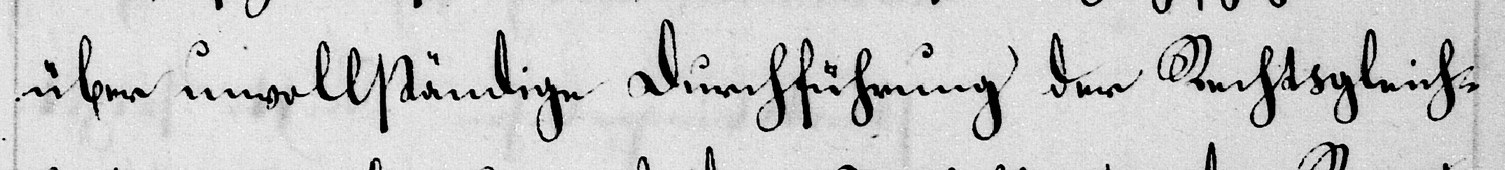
über unvollständige Durchführung der Rechtsgleich¬
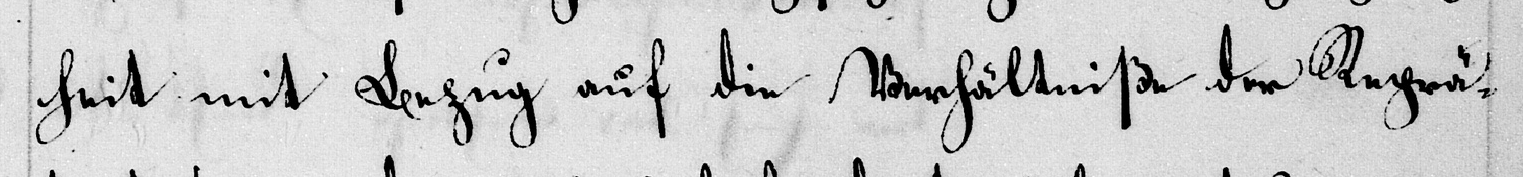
heit mit Bezug auf die Verhältniße der Reprä¬
